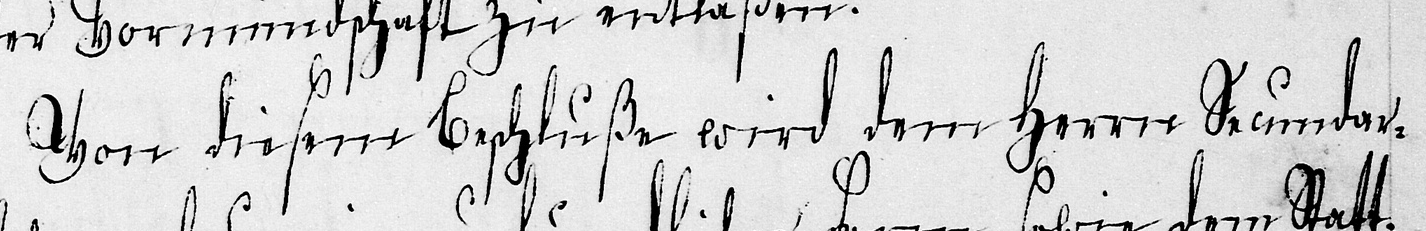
Von diesem Beschluße wird dem Herrn Secundar¬
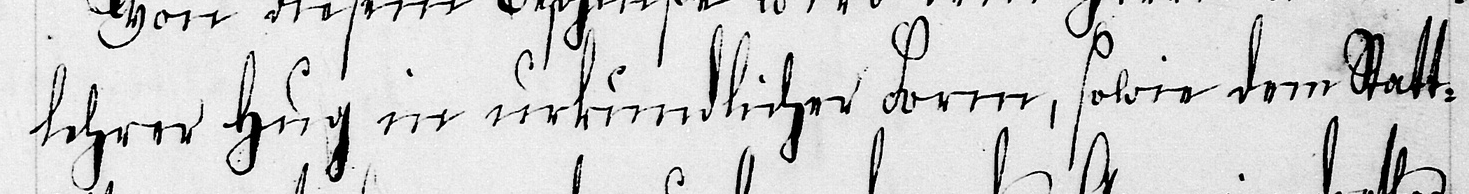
lehrer Hug in urkundlicher Form, sowie dem Stat¬
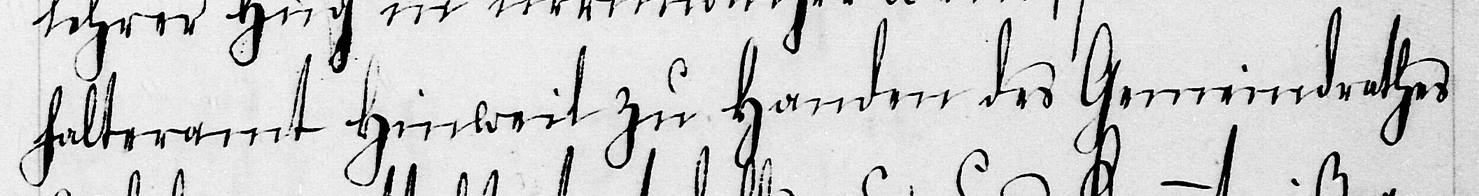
thalteramt Hinweil zu Handen des Gemeindrathes
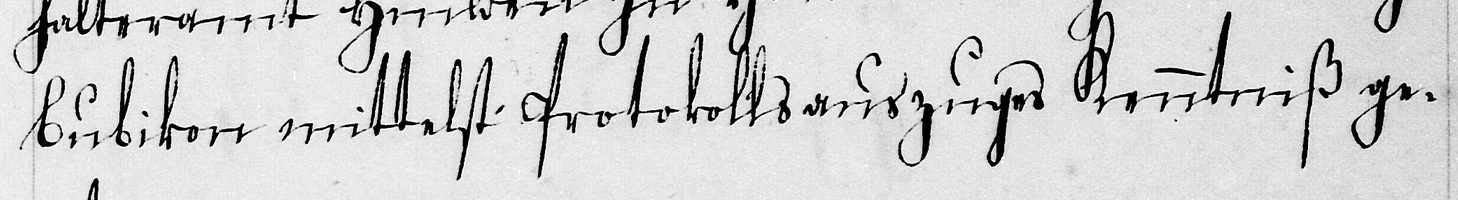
Bubikon mittelst Protokollsauszuges Kenntniß ge¬
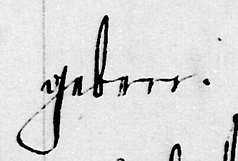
geben.
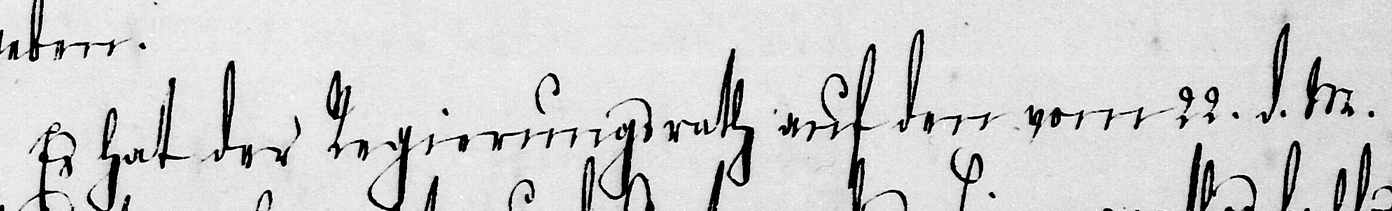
Es hat der Regierungsrath auf den vom 22. d. M.
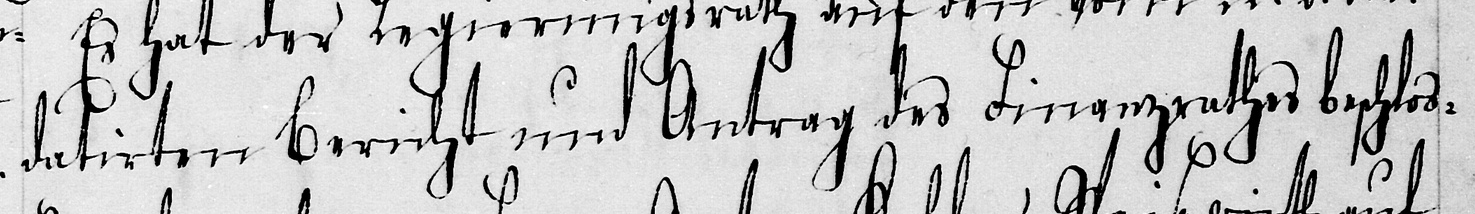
datirten Bericht und Antrag des Finanzrathes beschlo¬
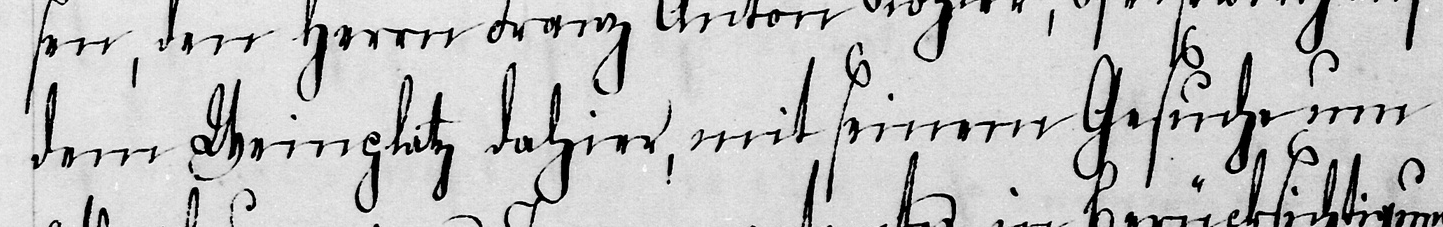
dem Weinplatz dahier, mit seinem Gesuche um
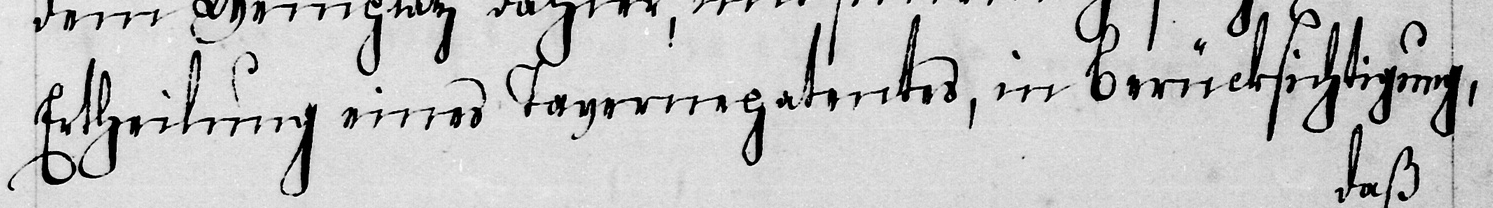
Ertheilung eines Tavernepatentes, in Berücksichtigung,
